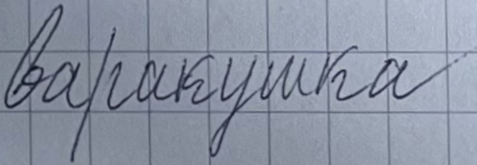варакушка
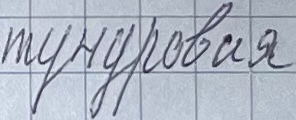тундровая
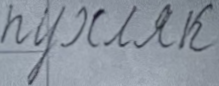пухляк
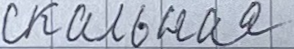скальная
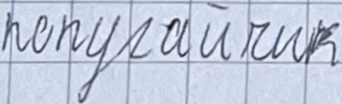попугайчик
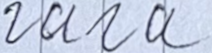гага
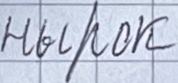нырок
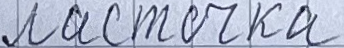ласточка
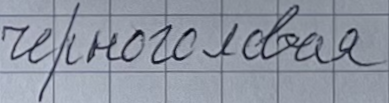черноголовая
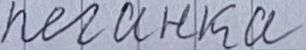пеганка
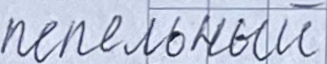пепельный
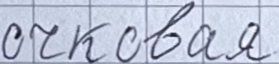очковая
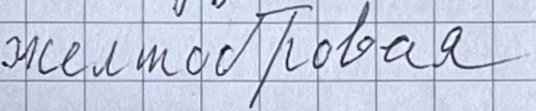желтобровая
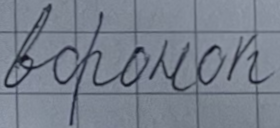воронок
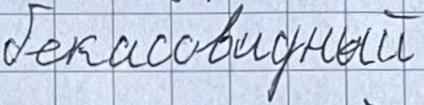бекасовидный
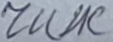чиж
